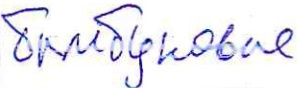бамбуковая
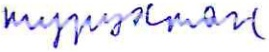турухтан
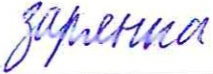зарянка
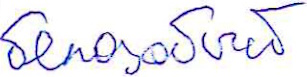белозобый
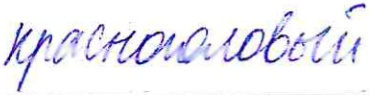красноголовый
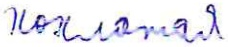хохлатая
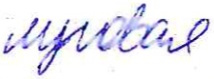луговая
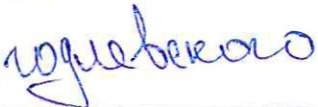годлевского
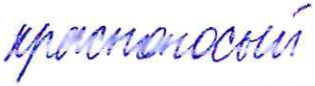красноносый
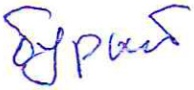бурый
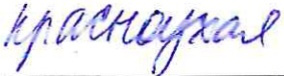красноухая
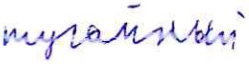тугайный
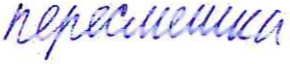пересмешка
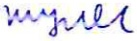тулес
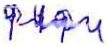фифи
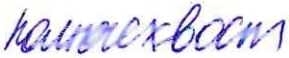колючехвост
